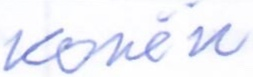конёк
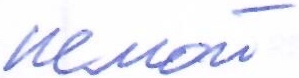немой
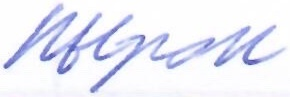пырок
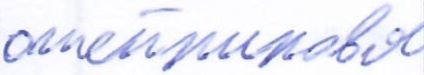ошейниковя
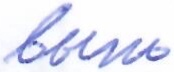выпь
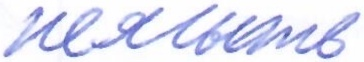неясыть
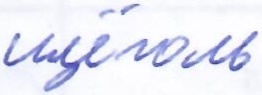щёголь
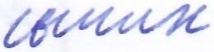сычик
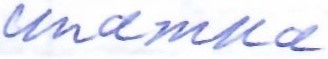ипатка
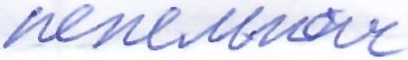пепельная
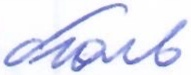бюль
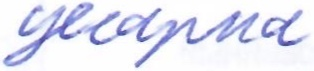уесарка
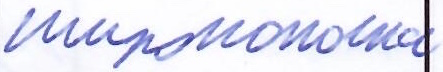широноноска
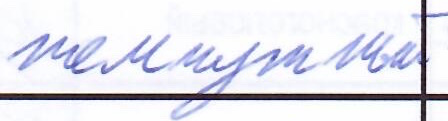жемчужный
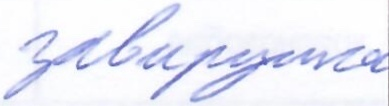завирушка
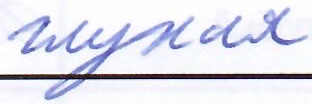глухая
